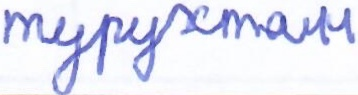турухтан
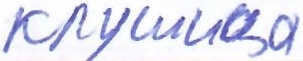клушица
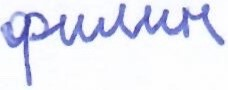филин
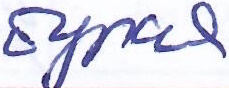бупая
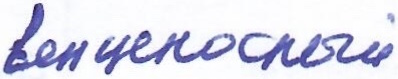венценосный
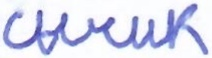сычик
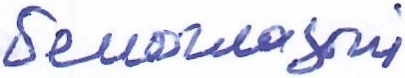белоглазый
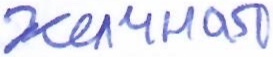желчная
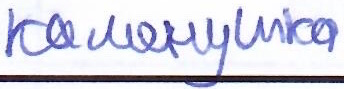каменушка
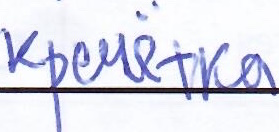кречётка
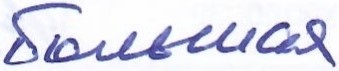большая
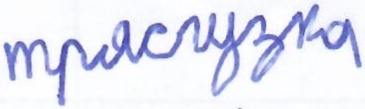трясгузка
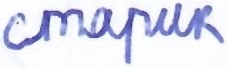старик
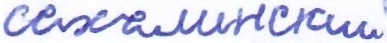сахалинскии
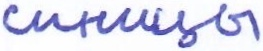синицы
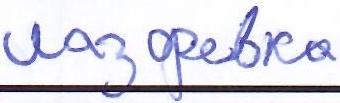лазоревка
